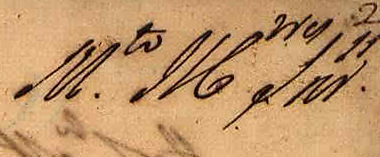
M.to Ill.res Snr.es
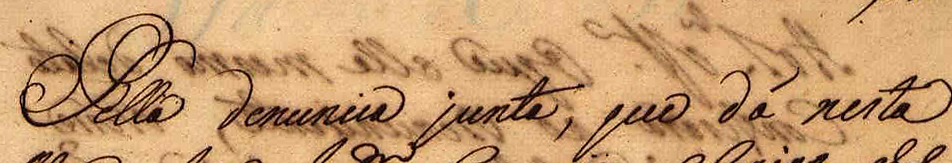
Pella denuncia junta, que dá nesta
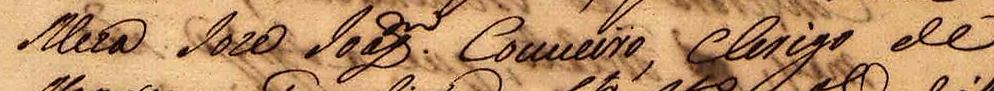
Meza Ioze Ioaq.m Couueiro, clerigo de
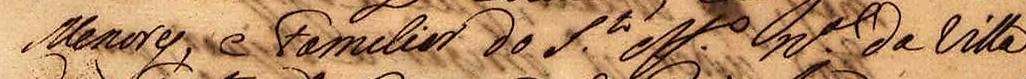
Menores, e Familiar do S.to off.o n.al da Villa
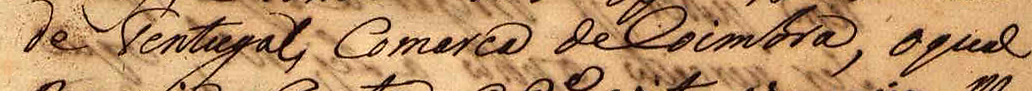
de Tentugal, Comarca de Coimbra, o qual
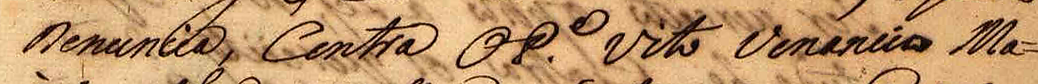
denuncia, Contra O P.e vito venancio Ma
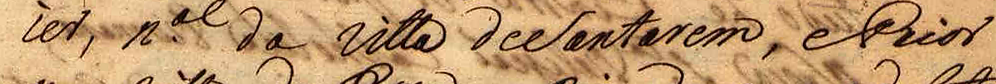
ier, n.al da villa de Santarem, e Prior
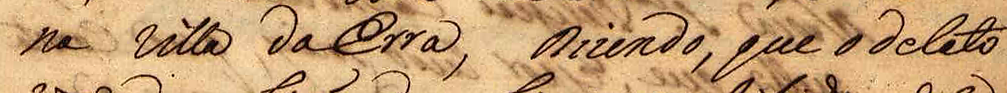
na villa da Erra, dizendo, que o delato
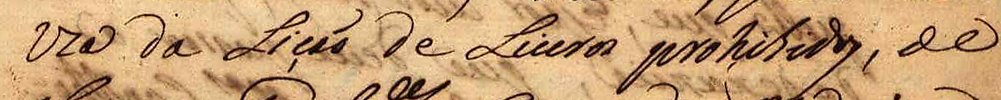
uza da Liçaõ de Liuros prohibidos, de
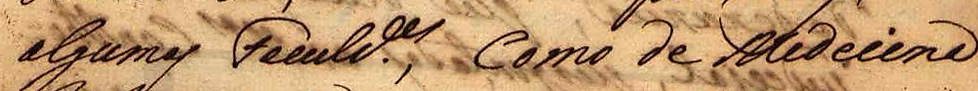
algumas Feculd.es, Como de Medecina
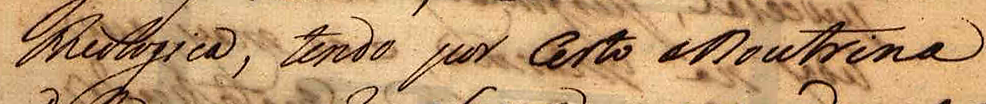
Theologica, tendo por certo a doutrina
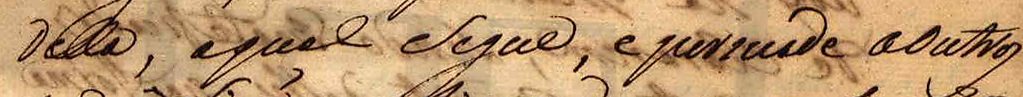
della, a qual segue, e persuade a outros
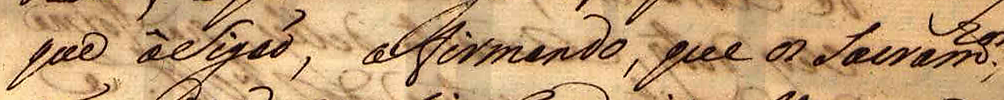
que a Sigaõ, afirmando, que os Sacram.tos,
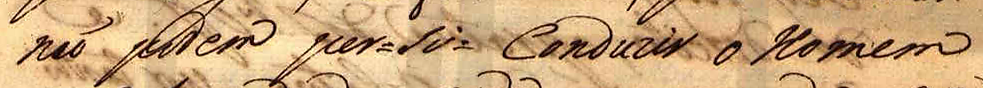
naõ podem per-si= conduzir o Homem
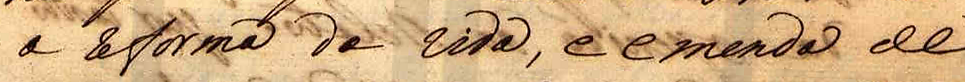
a Reforma da vida, e emenda de
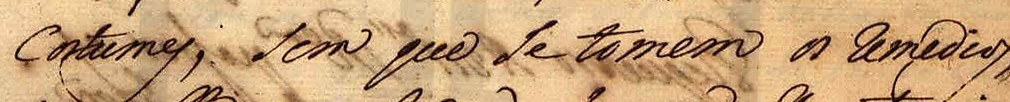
costumes, sem que se tomem os Remedios,
